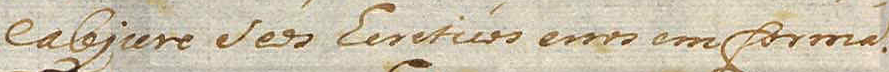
e abjure seos hereticos erros em forma:
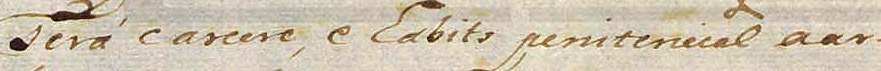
Terá carcere, e habito penitencial a ar
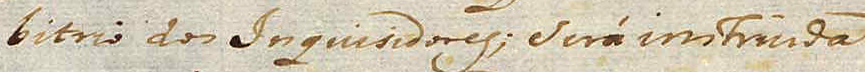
bitrio dos Inquisidores; será instruida
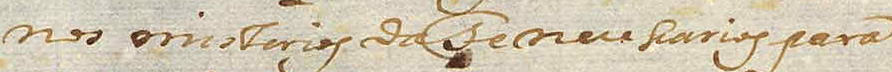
nos misterios da Fe necessarios para
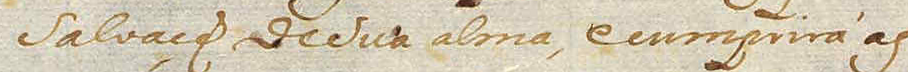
salvaçaõ de sua alma, e cumprira as
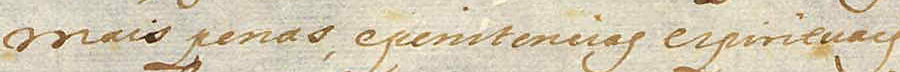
mais penas, e penitencias espirituais
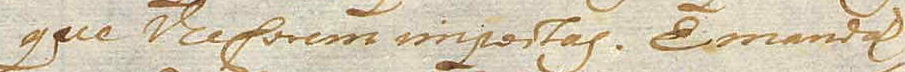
que lhe forem impostas. E mandaõ
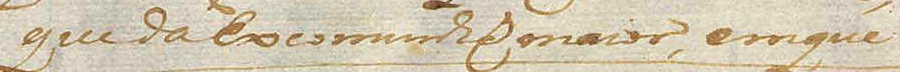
que da Excomunhaõ maior, em que
